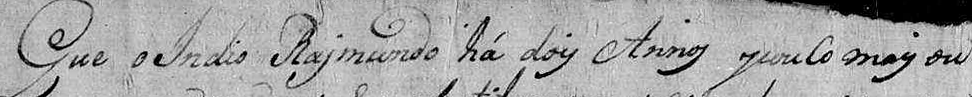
Que o Indio Rajmundo há dois Annos pouCo mais, ou
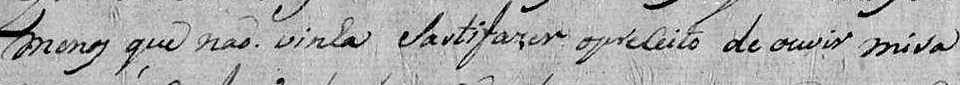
menos que naõ. vinha Sastifazer o preCeito de ouvir misa
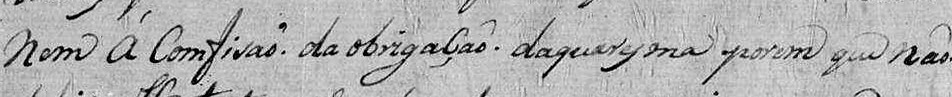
nem Á Comfisaõ. da obrigaÇaõ. da queresma porem que naõ.
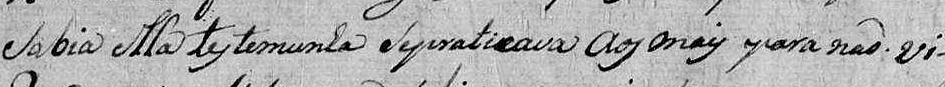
sabia ella testemunha se praticava aos mais para naõ. vi
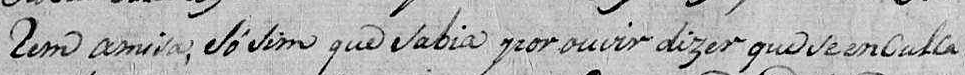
Rem a misa, só sim que sabia por ouvir dizer que se enCulCa
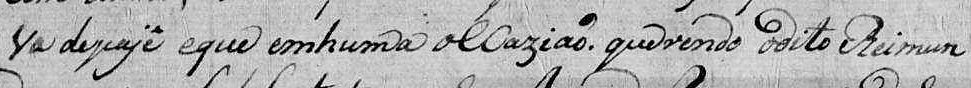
va de pajê e que em huma oCCaziaõ. querendo o dito Reimun
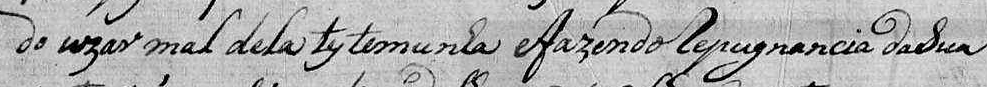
do uzar mal dela testemunha e fazendo Repugnancia da Sua
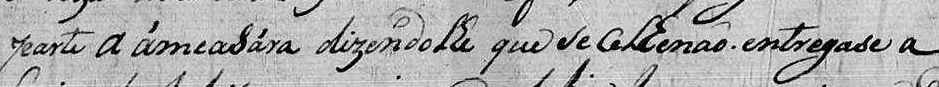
parte a ámeaSára dizendolhe que se Celhenaõ. entregase a
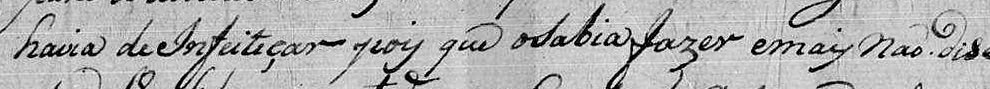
havia de Infeitiçar pois que o sabia fazer, e mais naõ. dise
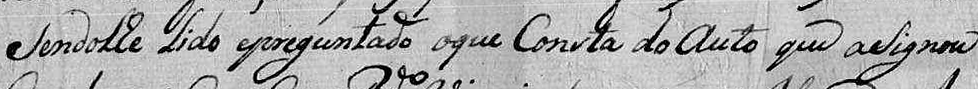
sendolhe Lido e preguntado o que Consta do auto que aSignou
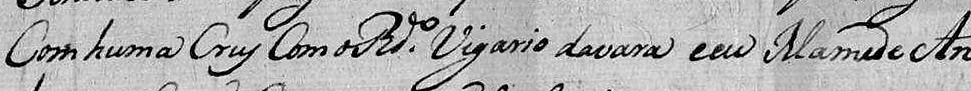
Com huma Crus Com o Rd.o Vigario da vara e eu Mamede An
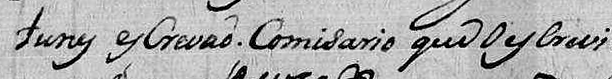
tunes esCrevaõ. Comisario que o esCrevi.
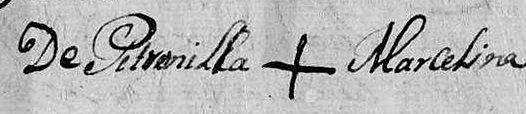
De Petronilla + Marcelina
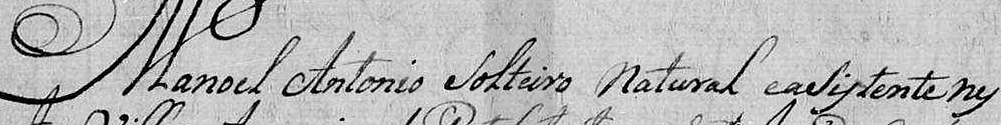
Manoel Antonio solteiro naturaL e asistente nes
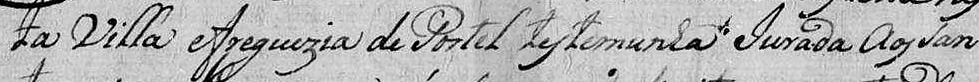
da Villa e freguezia de Portel testemunha Iurada aos san
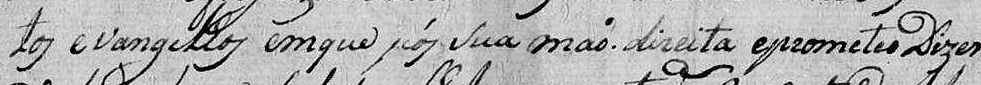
tos evangelhos em que pós sua maõ. direita e prometeo Dizer
